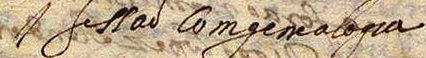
1a Sessaõ Com genealogia
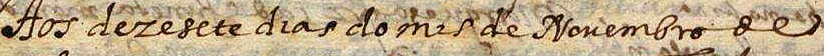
Aos dezesete dias do mes de Nouembro de
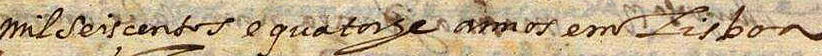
mil seisçentos e quatorze annos em Lisboa
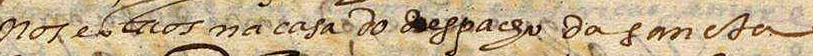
nos estaos na casa do despacho da sancta
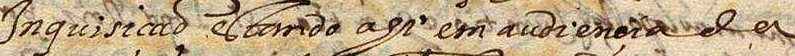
Inquisiçaõ estando ahi em audiençia da
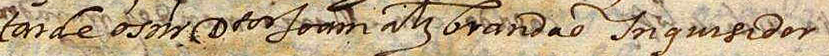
tarde o sn̄r Dtor Joam al̄z brandaõ Inquisidor
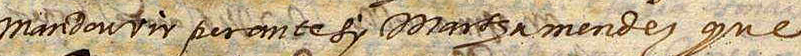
mandou vir perante sy Martha mendez que
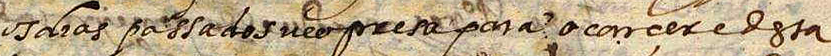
os dias passados ueo presa para o carçere desta
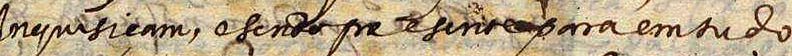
Inquisiçam, e sendo presente para em tudo
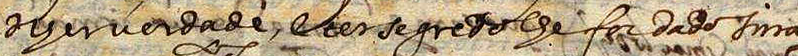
dizer uerdade, e ter segredo lhe foi dado Iura
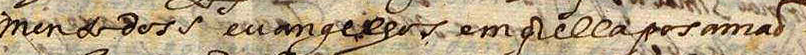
mento dos stos euangelhos em q̄ ella pos a maõ
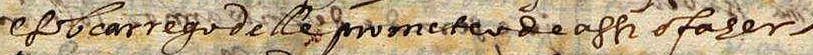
e sob carrego delle prometeo de assi o fazer.
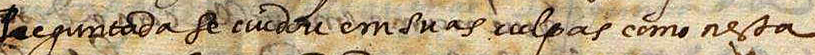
Preguntada se cuidou em suas culpas como nesta
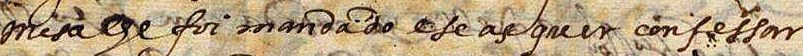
mesa lhe foi mandado e se as quer confessar
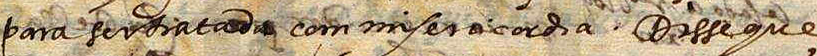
para ser tratada com misericordia. Disse que
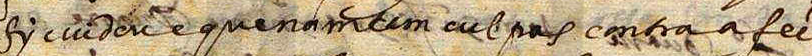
sy cuidou e que nam tem culpas contra a feé
